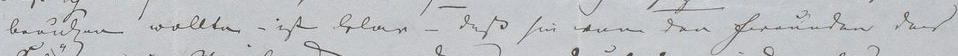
benutzen wollte, ist klar, daß sie von den Freunden des
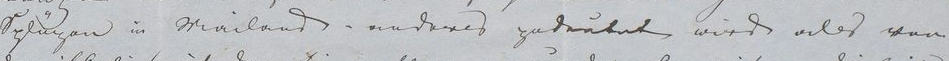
Splügen in Mailand anders gedeutet wird als von
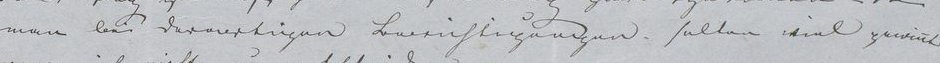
man bei derartigen Berichtigungen selten viel gewinnt
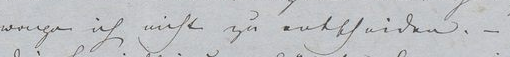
wage ich nicht zu entscheiden. –
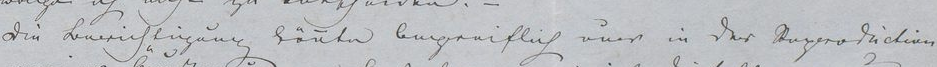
Die Berichtigung könnte begreiflich nur in der Reproduction
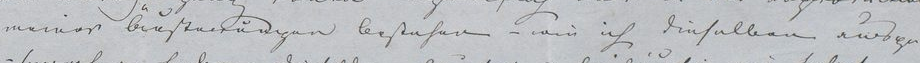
meiner Äußerungen bestehen, wie ich dieselben ausge-
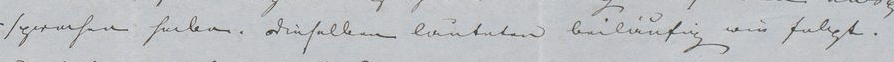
sprochen habe. Dieselben lauteten beiläufig wie folgt.
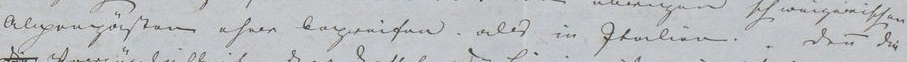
Alpenpäßen eher begreifen, als in Italien. Denn die
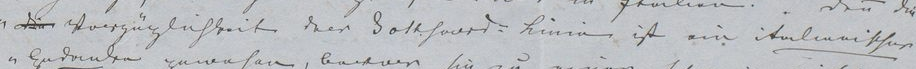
die Vorzüglichkeit der Gotthard-Linie ist ein italienischer
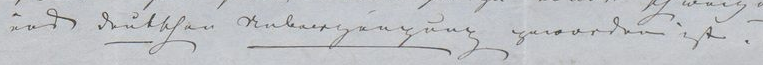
und deutschenUeberzeugung geworden ist.»
